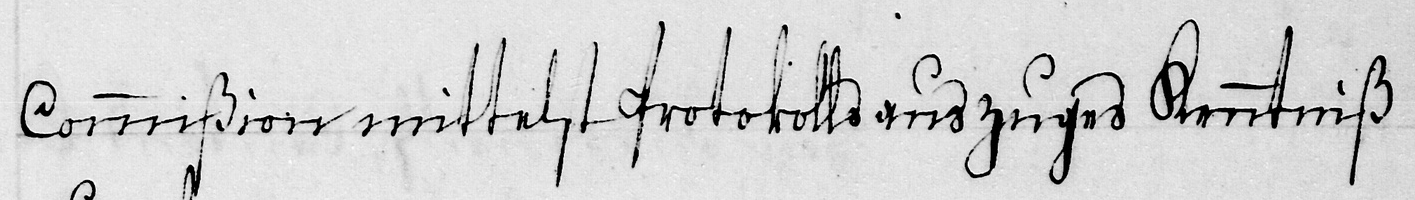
Commißion mittelst Protokollsauszuges Kenntniß
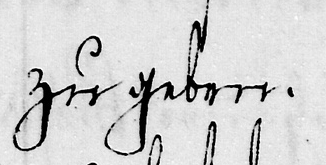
zu geben.
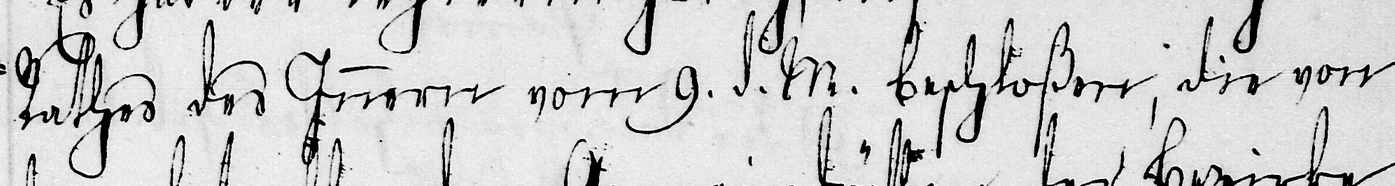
Rathes des Innern vom 9. d. M. beschloßen, die von
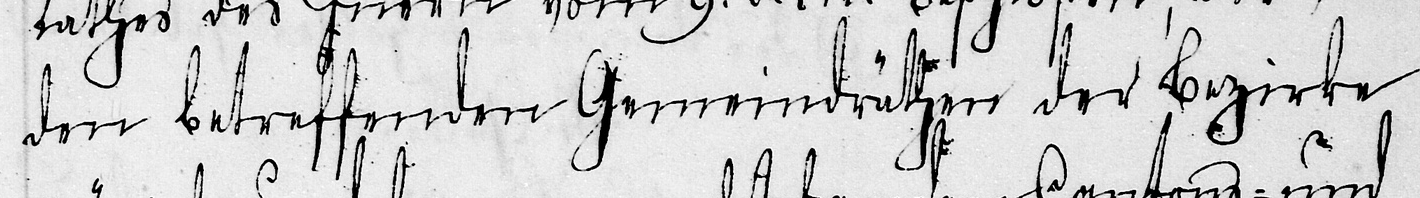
den betreffenden Gemeindräthen der Bezirke
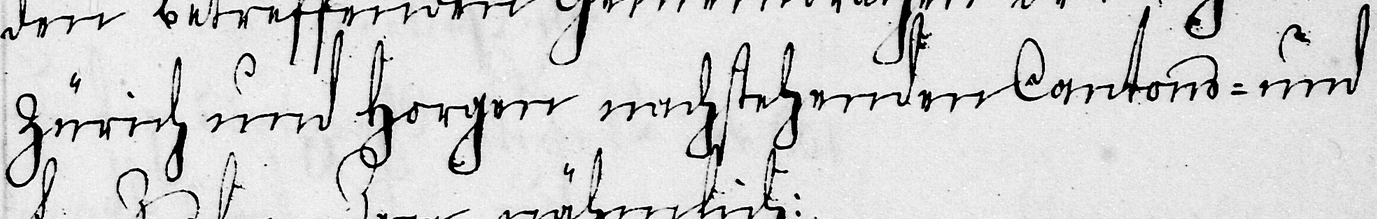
Zürich und Horgen nachstehenden Cantons- und
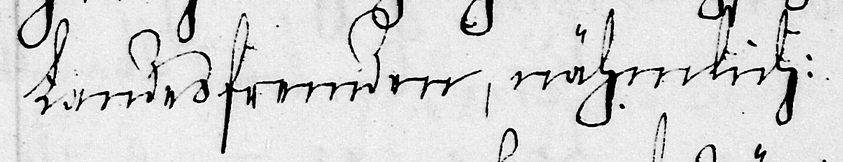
Landesfremden, nähmlich:
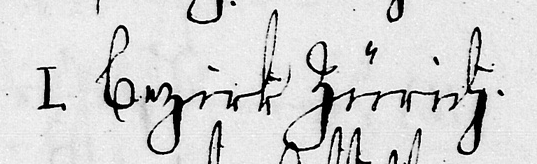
I. Bezirk Zürich
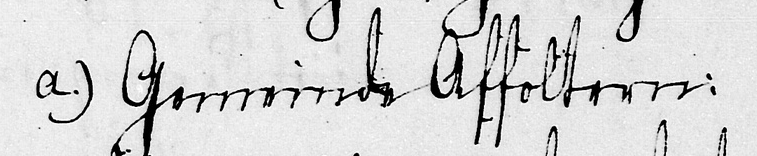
a.) Gemeinde Affoltern:
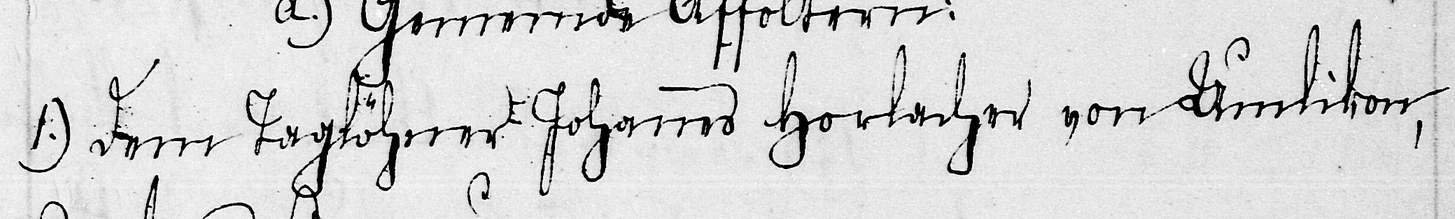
1.) Dem Taglöhner Johannes Horlacher von Umlikon,
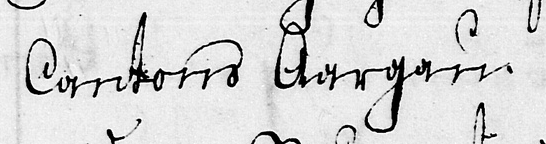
Cantons Aargau.
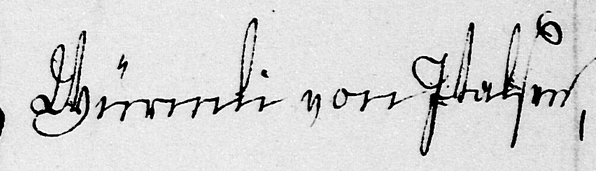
Würmli von Italsen,
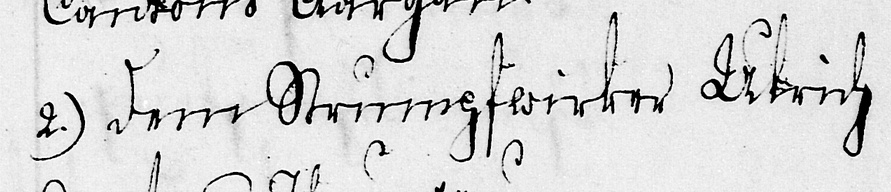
2.) Dem Strumpfwirker Ulrich
